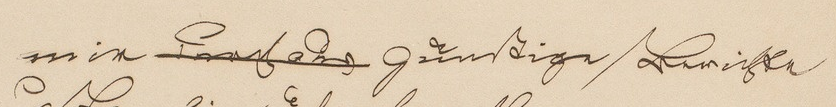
mir durchaus günstige Berichte
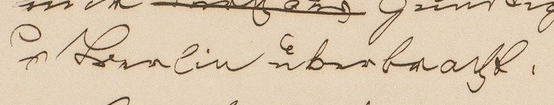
aus Berlin überbracht.
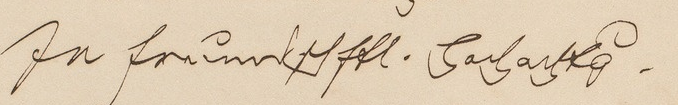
In freundschftl. Hochachtg.
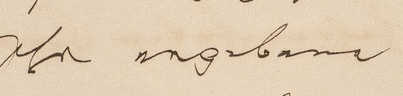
Ihr ergebene
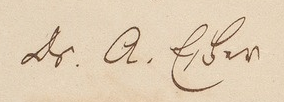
Dr. A. Escher
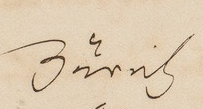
Zürich
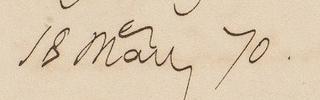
18 März 70.
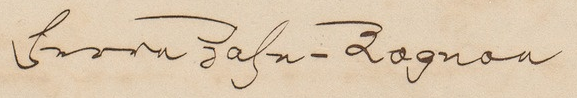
Herrn Zahn-Rognon
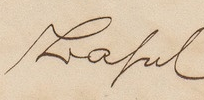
Basel
